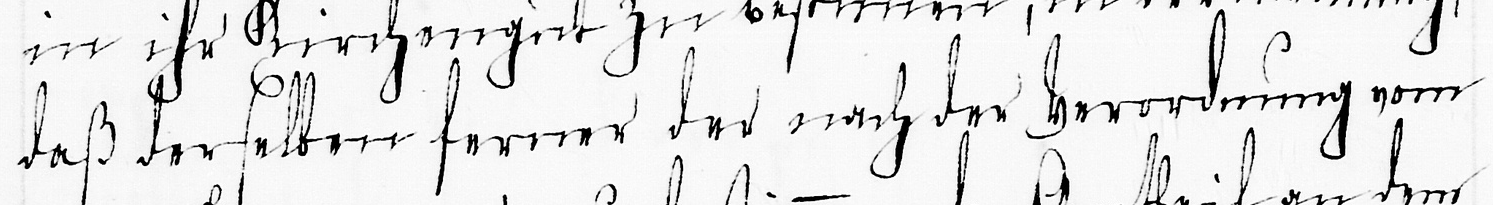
daß derselben ferner der nach der Verordnung vom
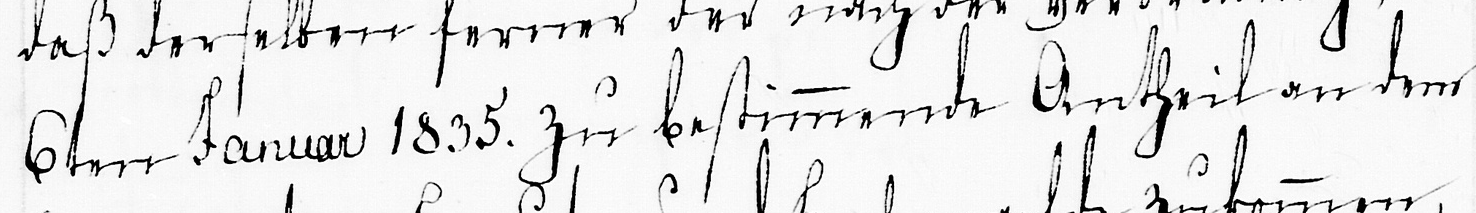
6ten Januar 1835. zu bestimmende Antheil an dem
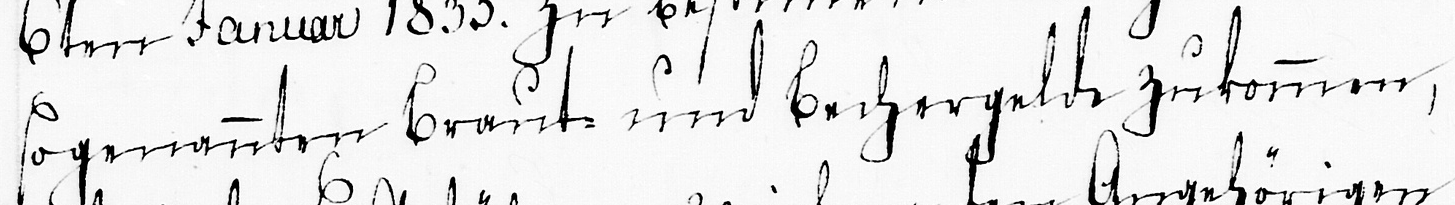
sogenannten Braut- und Bechergelde zukommen,
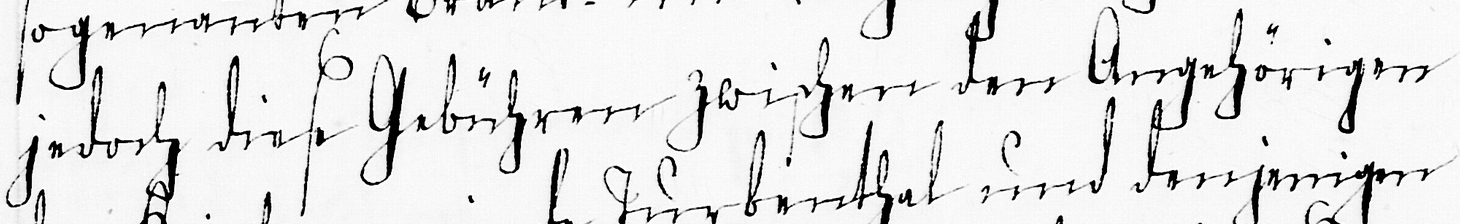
jedoch diese Gebühren zwischen den Angehörigen
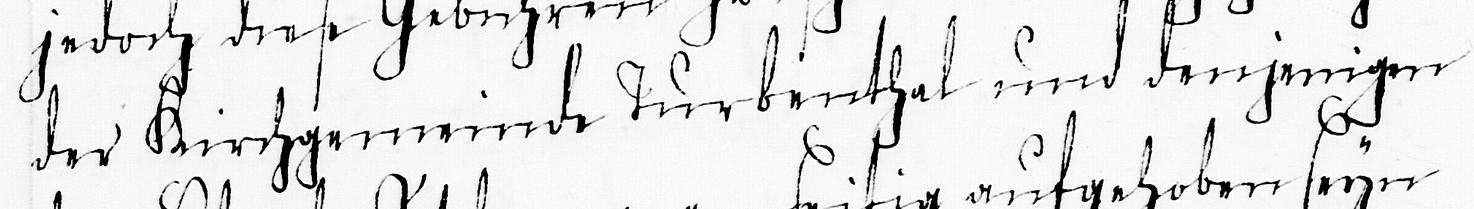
der Kirchgemeinde Turbenthal und denjenigen
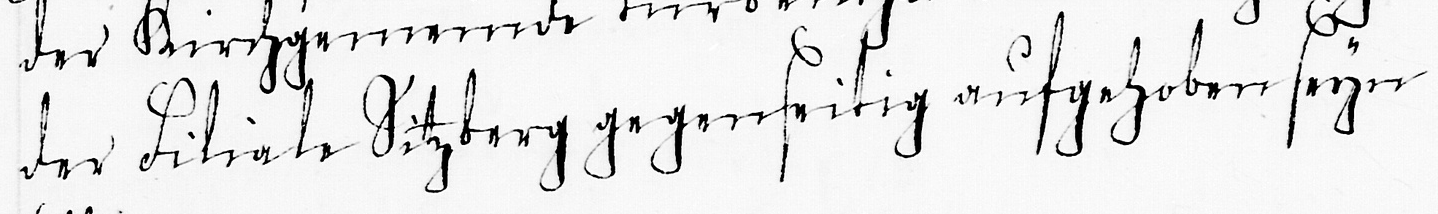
der Filiale Sitzberg gegenseitig aufgehoben seyn
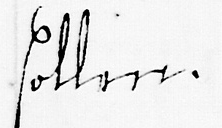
sollen.
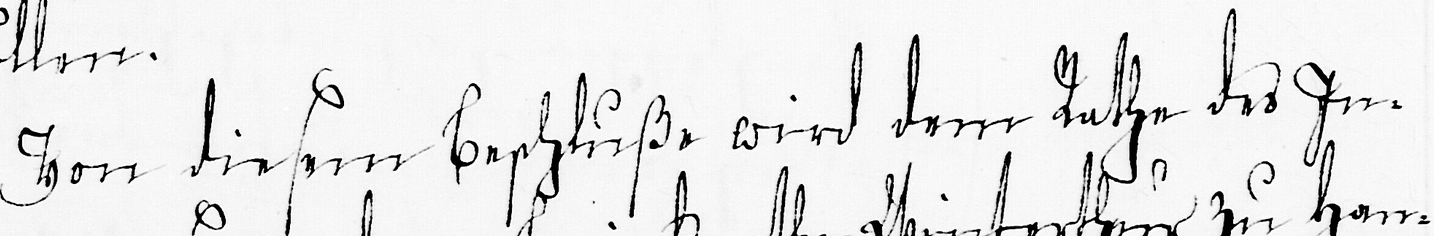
Von diesem Beschluße wird dem Rathe des In¬
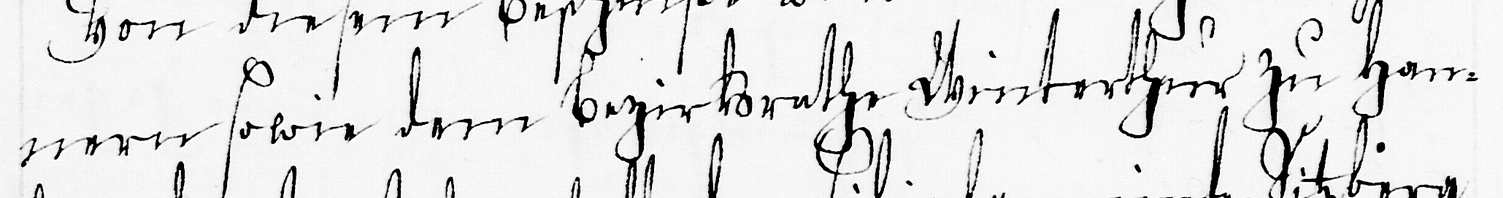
nern sowie dem Bezirksrathe Winterthur zu Han¬
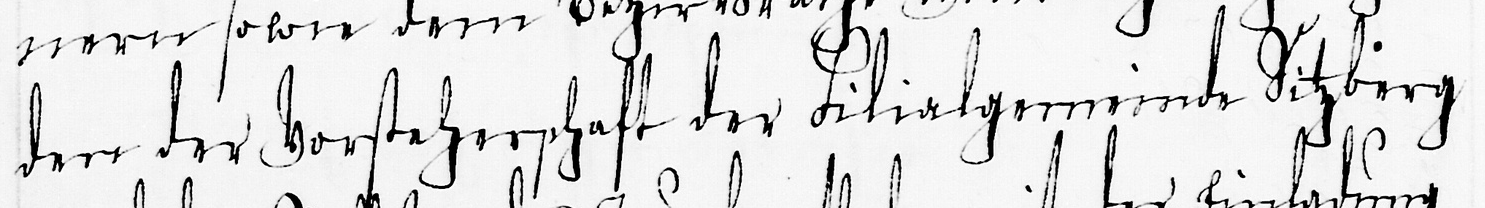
den der Vorsteherschaft der Filialgemeinde Sitzberg
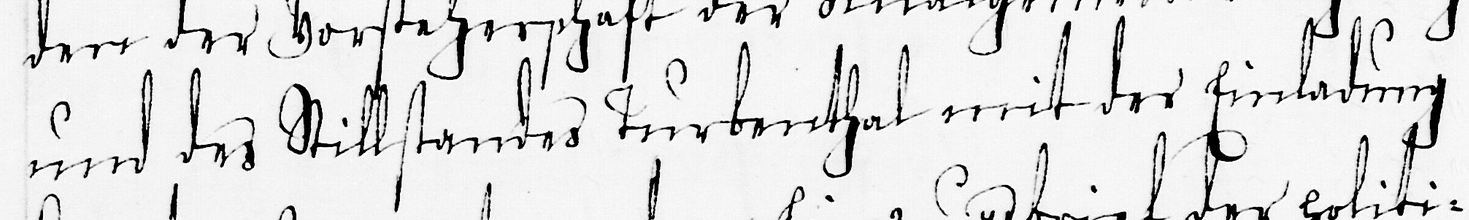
und des Stillstandes Turbenthal mit der Einladung
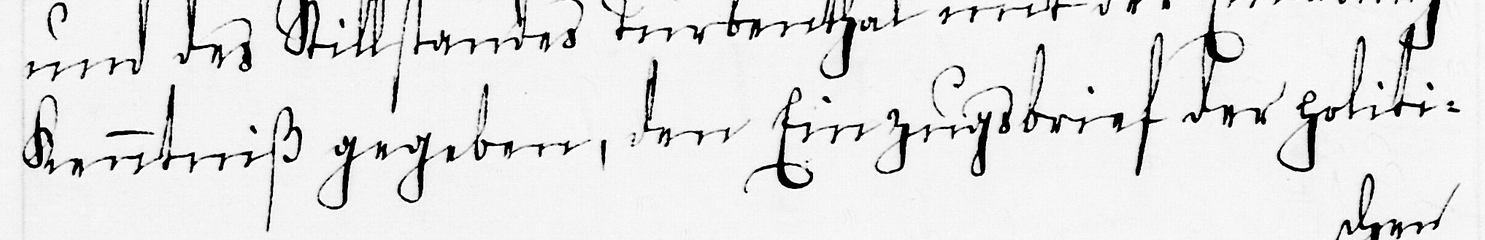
Kenntniß gegeben, den Einzugsbrief der politi-
